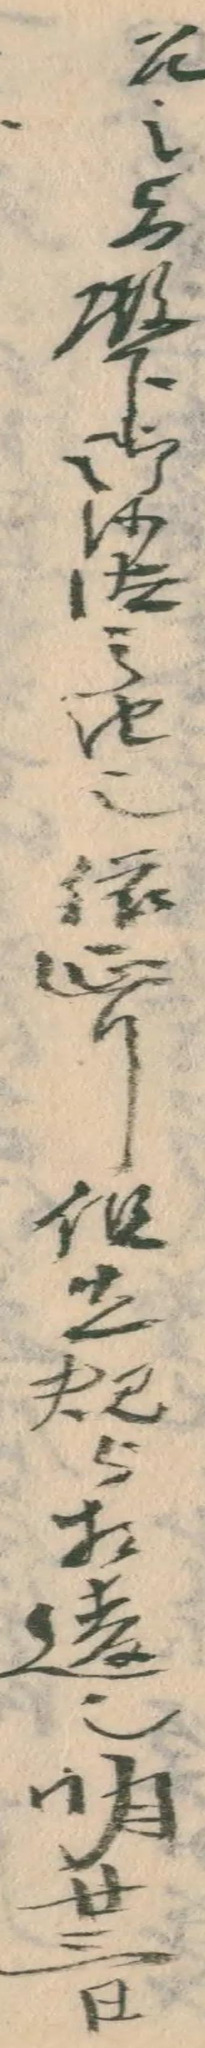召之旨殿下御沙汰之由也依延引但先規と相違也明廿三日
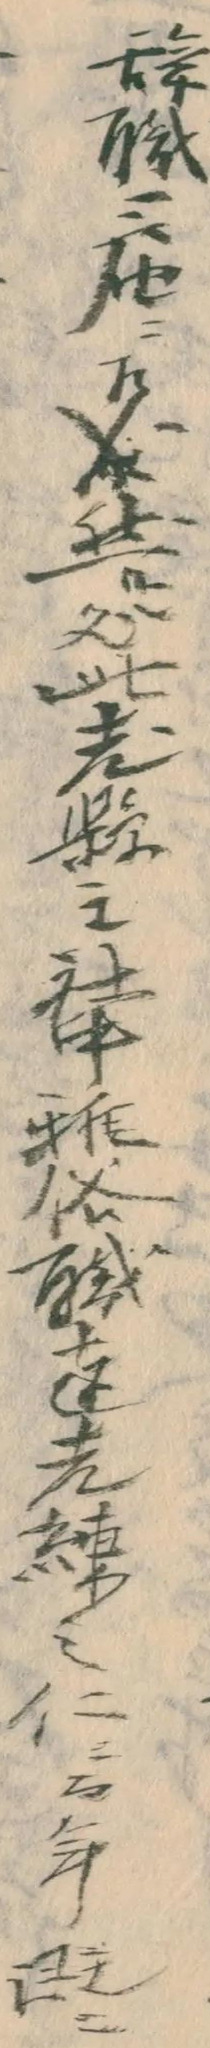辞職御届ニ相成然ル処此老縣主社中雅俗職達老練之仁ニ而年既ニ
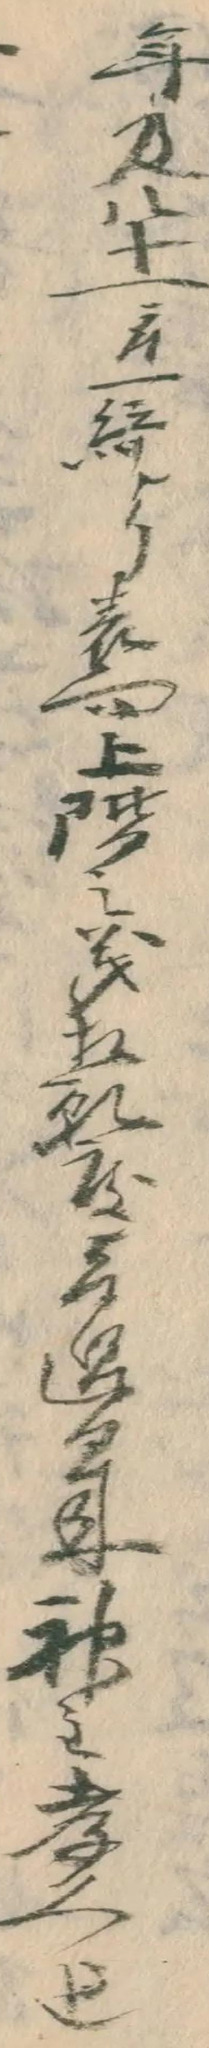年及八十ニ付一統より表向上階之義相願度旨過日来神主孝久迄
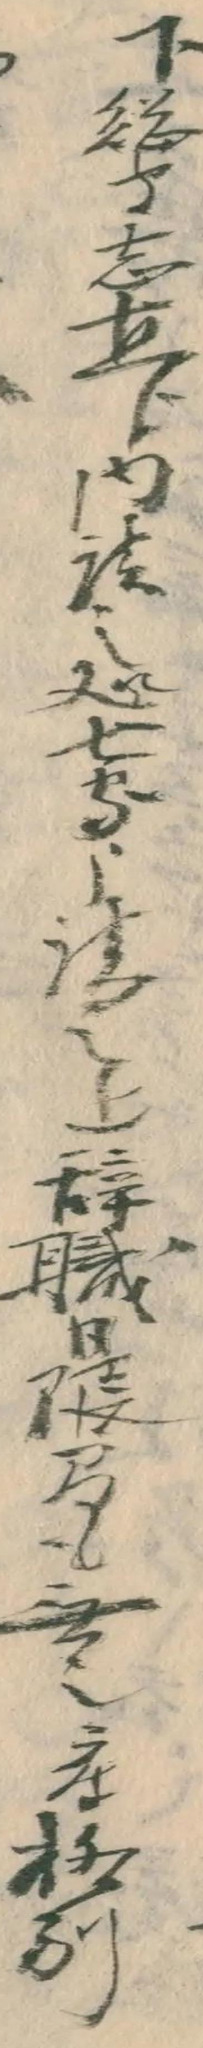下総守志直ゟ内談之処七家申請之上辞職日限間も無之ニ付格別
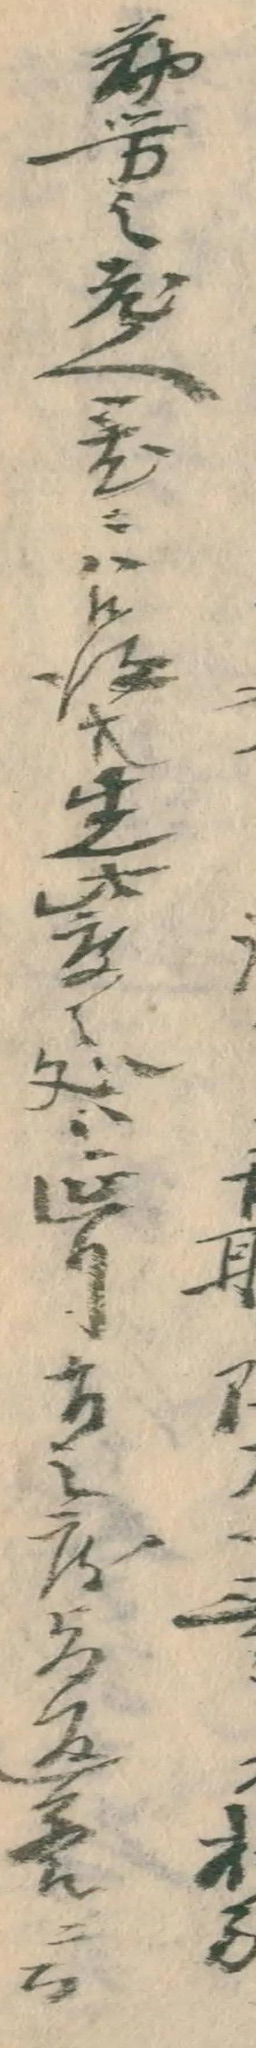勤労之老人候尤ニハ候得共先此度之処御延引有之度旨返答ニ而

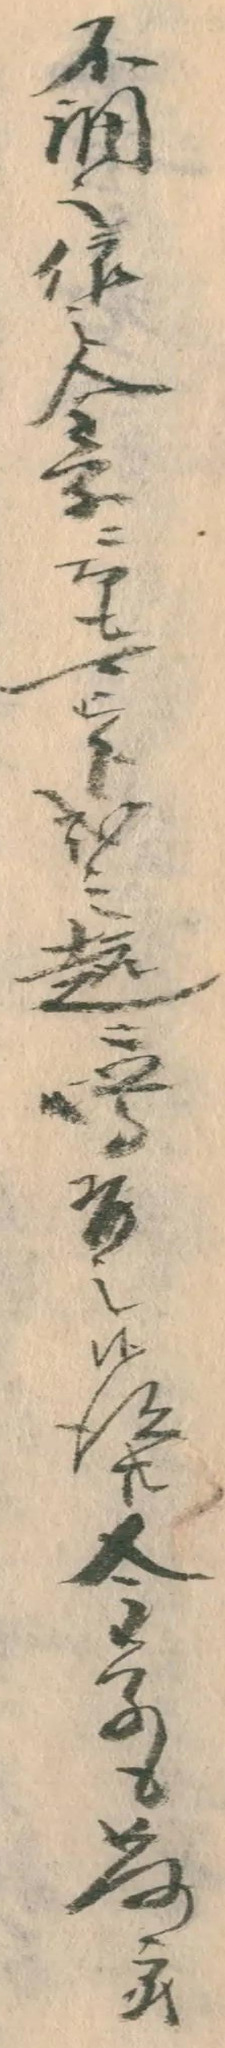不調也依之金子ニ而も可被下哉之趣ニ噂有之候得共金子も如何ニ付
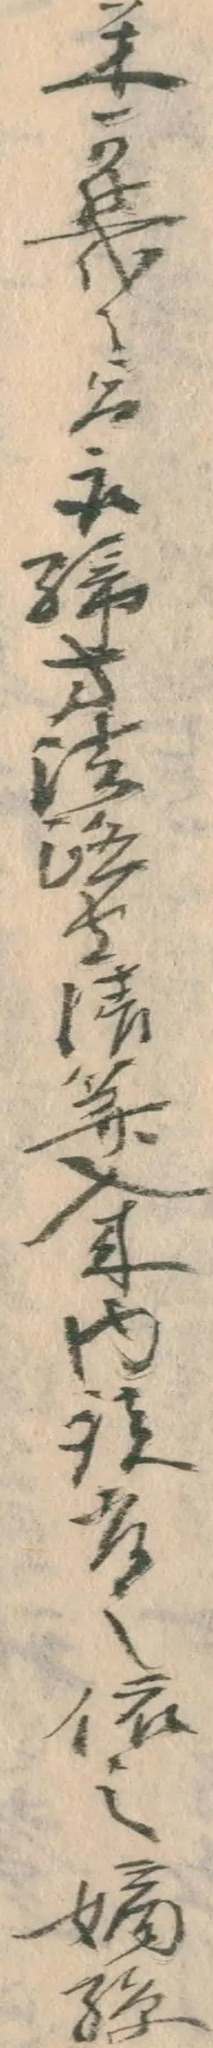米可然哉之旨取締方淡路守清算入来内談有之依之嫡孫
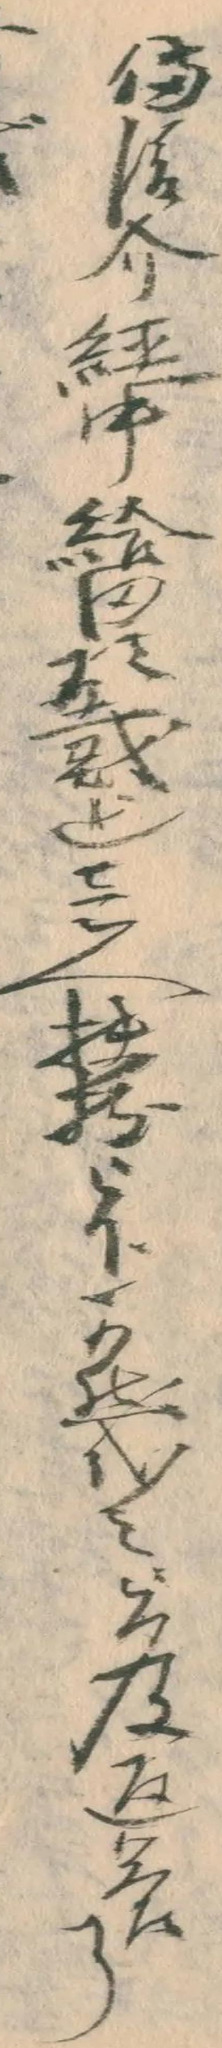備後介経中給田頂戴迄壱人扶持被下可然哉之旨及返答了
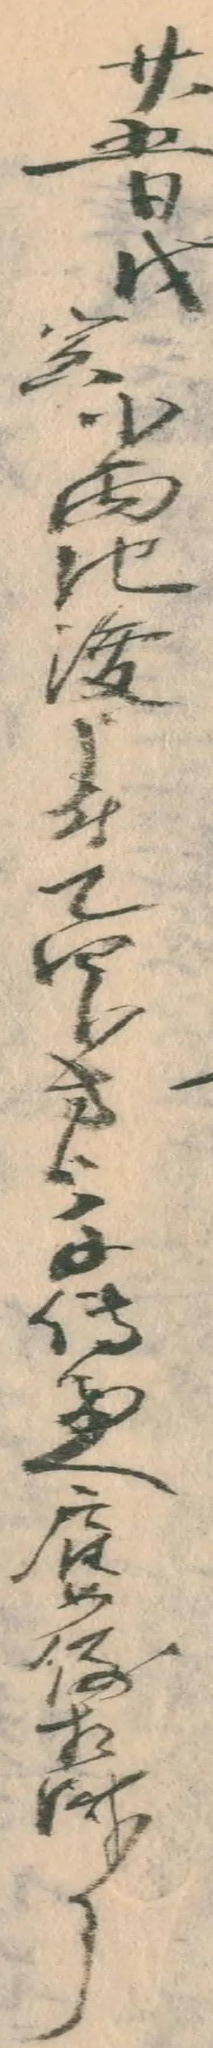廿五日戊寅小雨地渡申付乙四郎方ゟ傳両人雇如例相済了
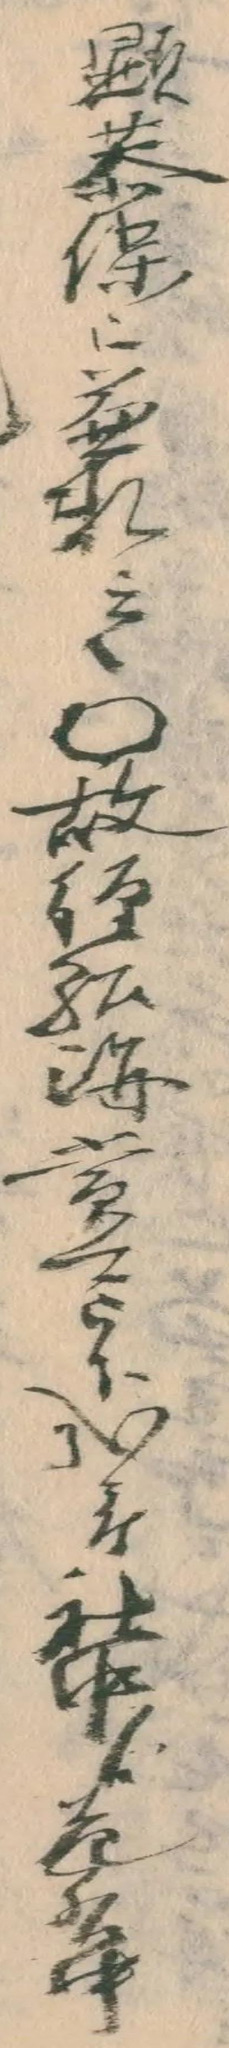顕恭保被兼頼云〻〇故経紹跡賞可被下哉ニ付社中ゟ老若中
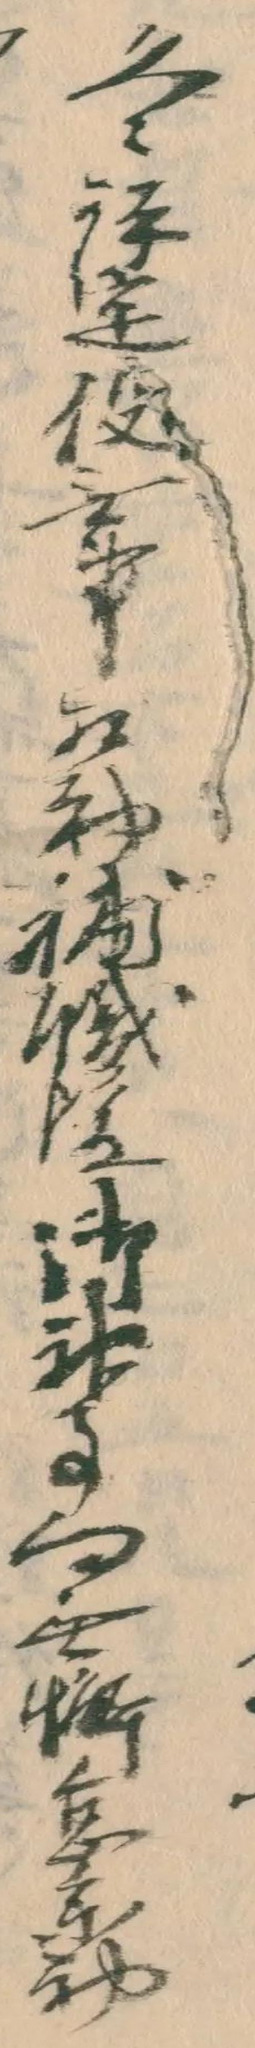久々評定役無事相勤補職後御神事向無懈怠参勤
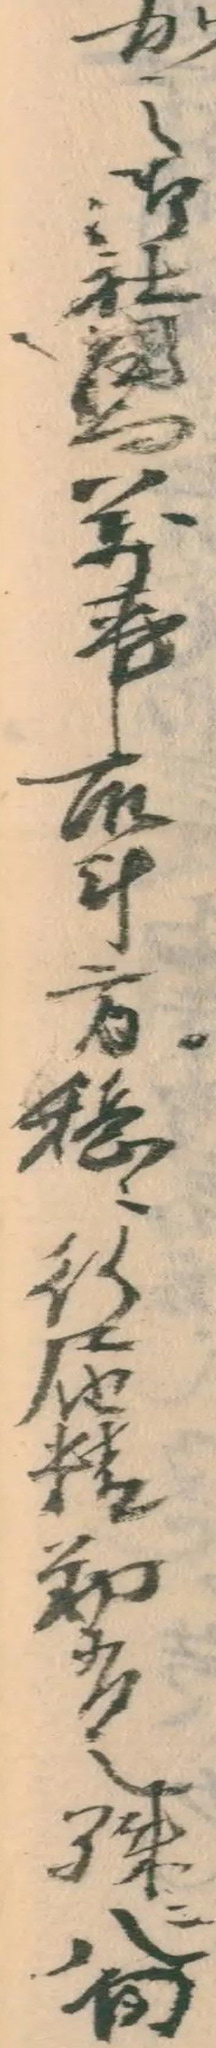加之御社用向萬事取斗方穏ニ行届精勤有之殊ニ八旬
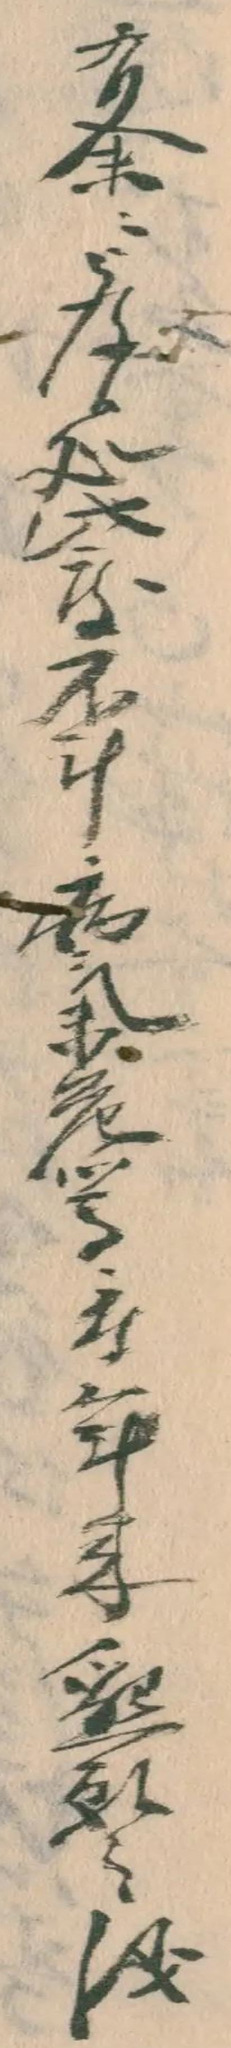有余ニ被致候処此度不斗病氣危篤ニ付懇願之儀
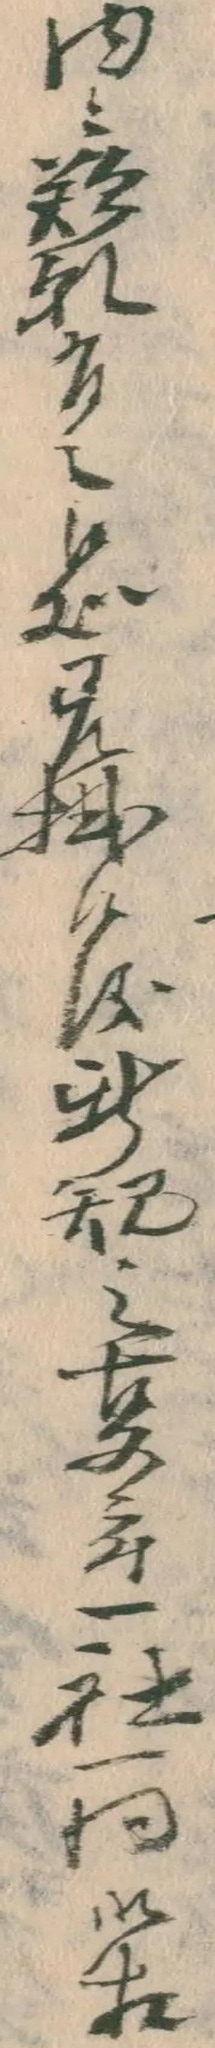内々歎願有之候処差掛候儀新規之事ニ付一社一同御相
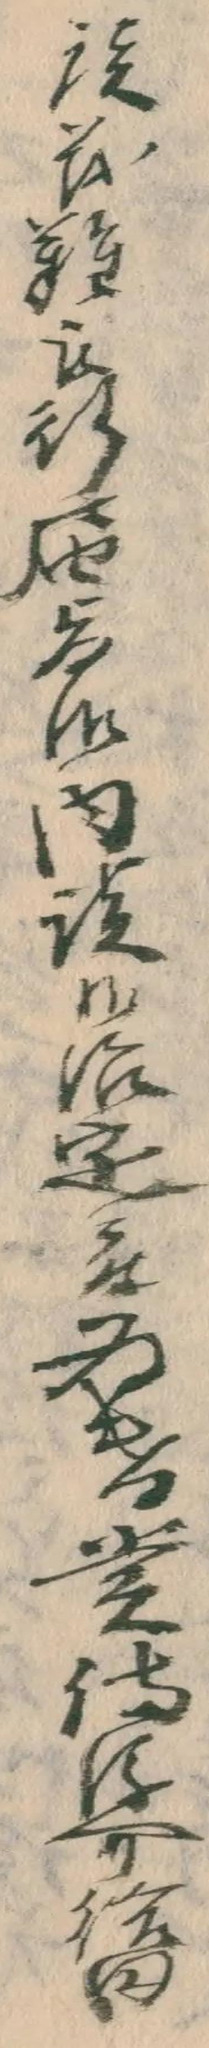談も難被行届旨御内談御治定ニ付為遣賞備後介給田
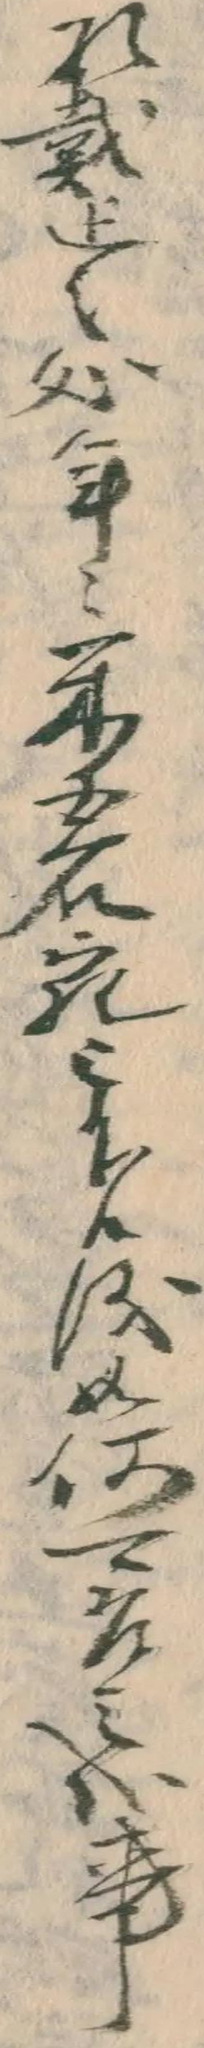頂戴迄之処年々米五石宛被下候儀如何可差之哉事
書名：賀茂社記録. 第70冊
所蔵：国立国会図書館 National Diet Library, JAPAN
